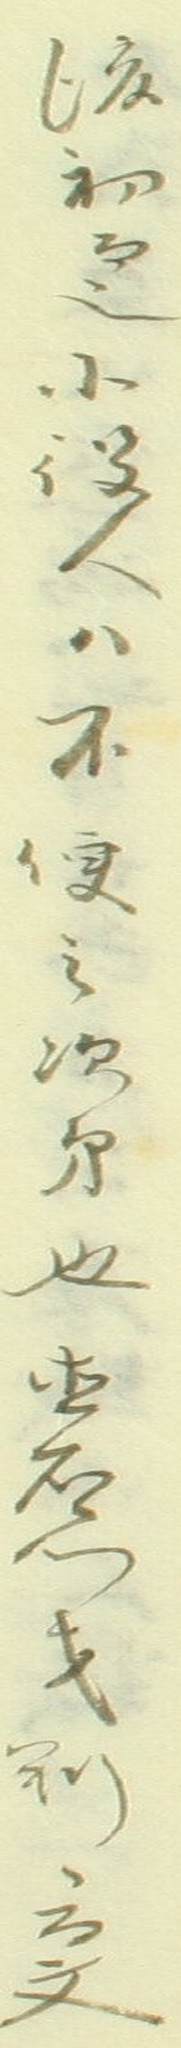後初而也小役人は不便之次第也直右衛門才判へ而文
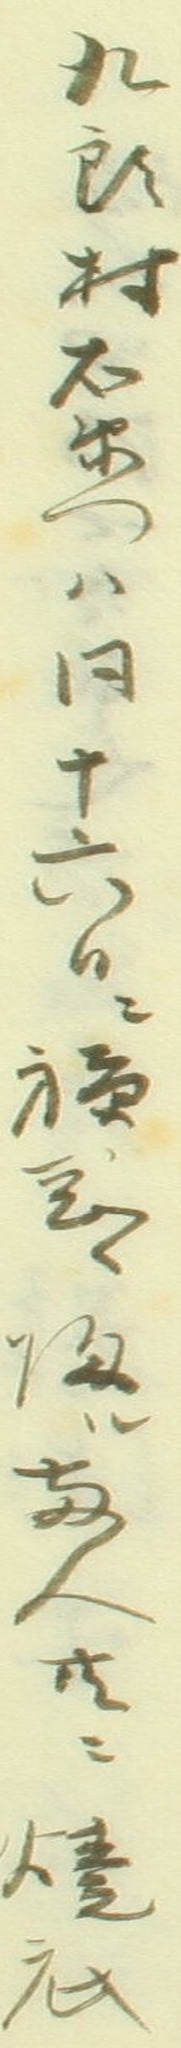九朗村右衛門は同十六日に福岡へ帰る両人共に焼底
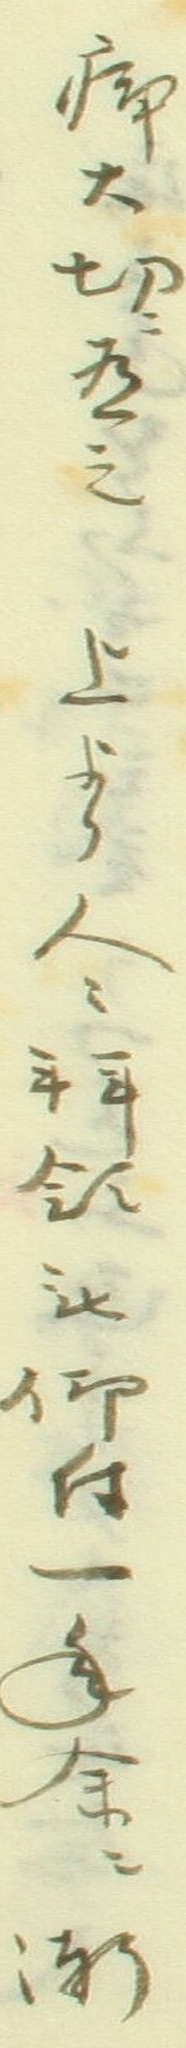痛大切に有之上より人々に拝領被仰付一年余に漸

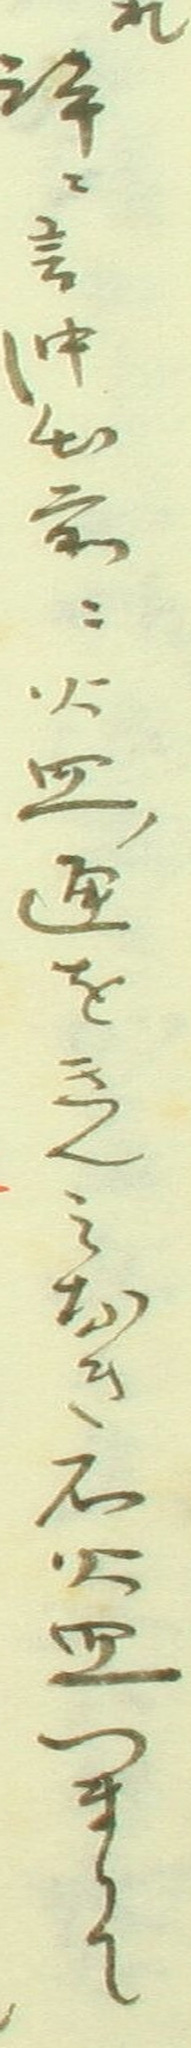詳に言沖出前に火皿の通をきんみなき石火皿つまりて
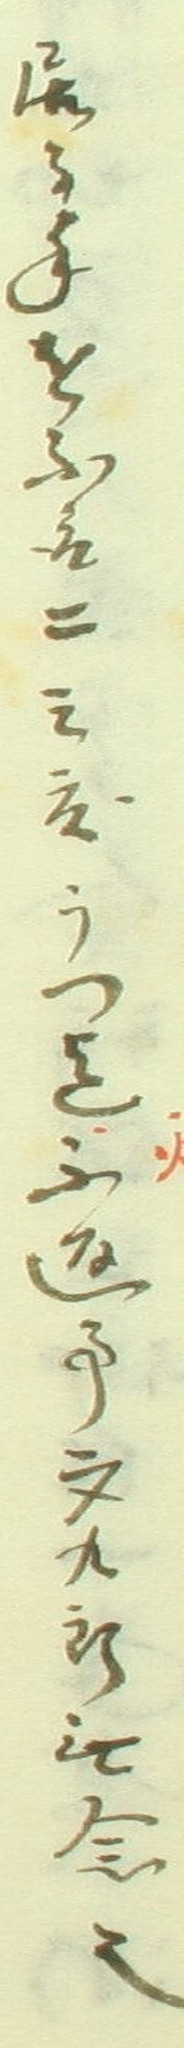居る手を不取二三度うつ迠不通事文九朗無念也
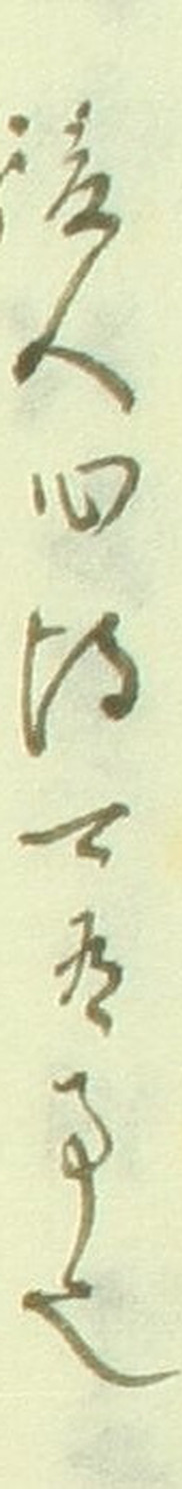役人心得可有事也
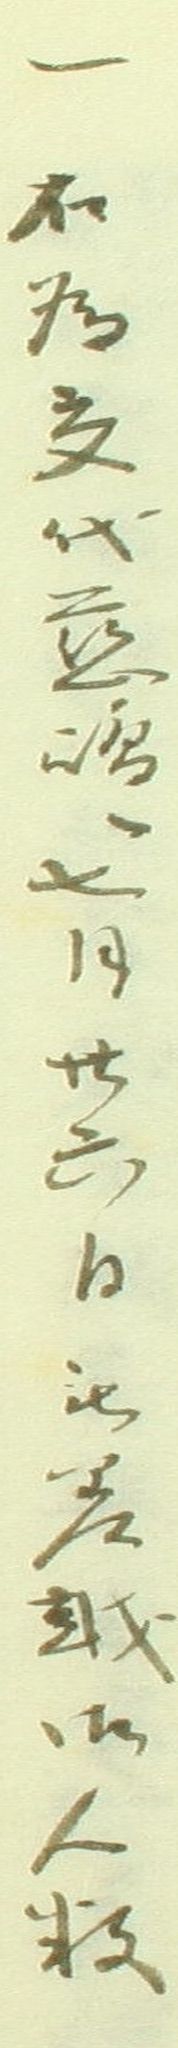一右為交代慈嶋へ七月廿六日被差越御人数
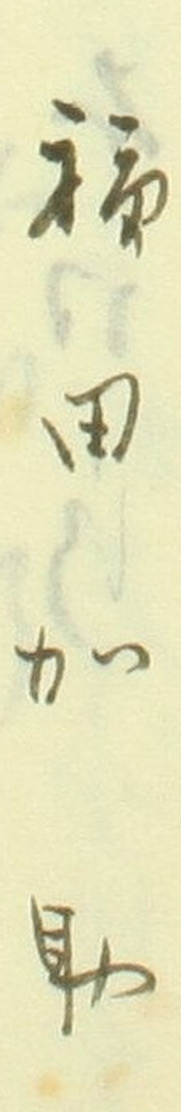福田加助
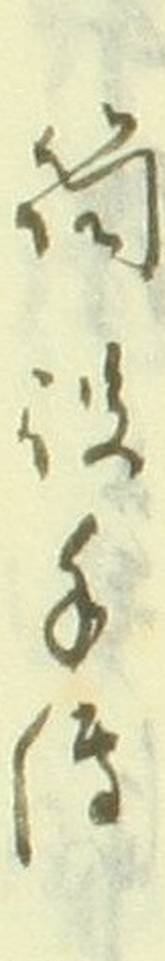筒役手伝
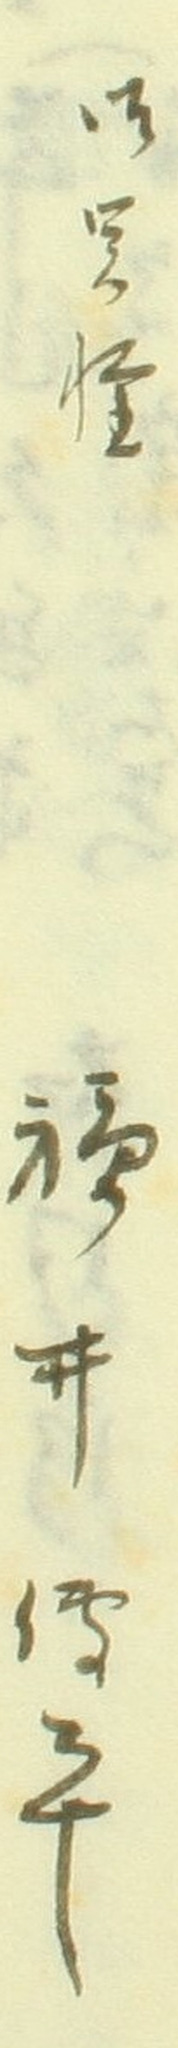御足軽福井伝米平
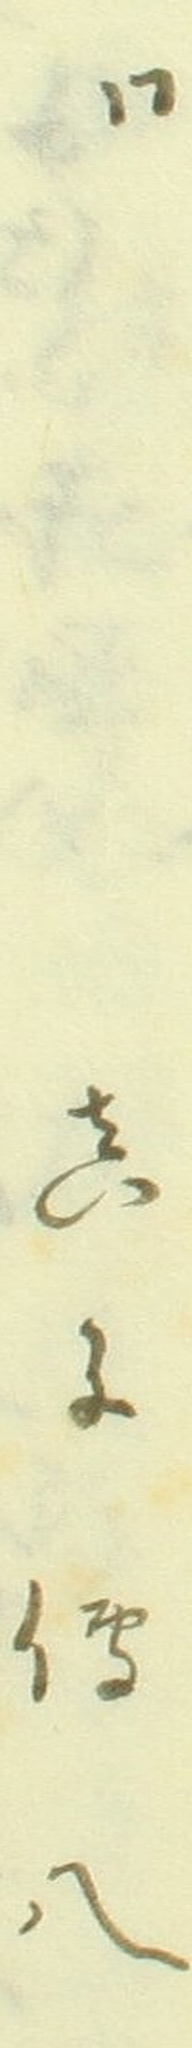同真子伝八
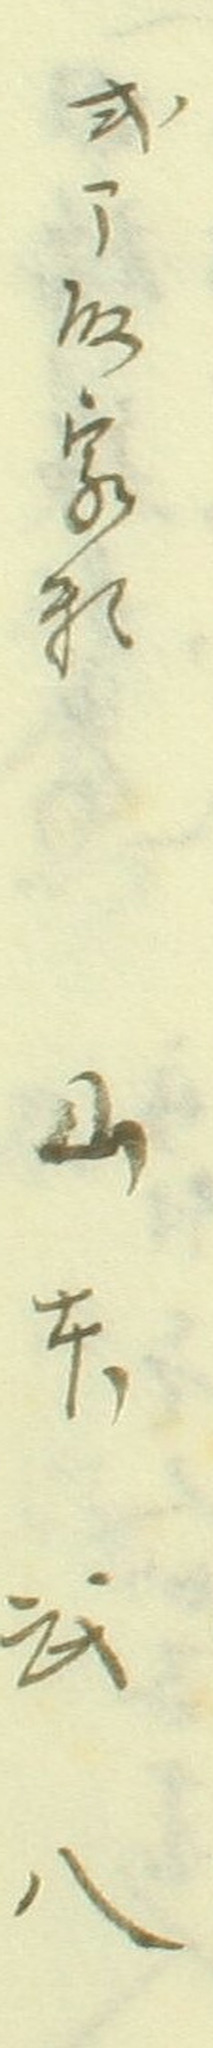式了殿家頼山本武八
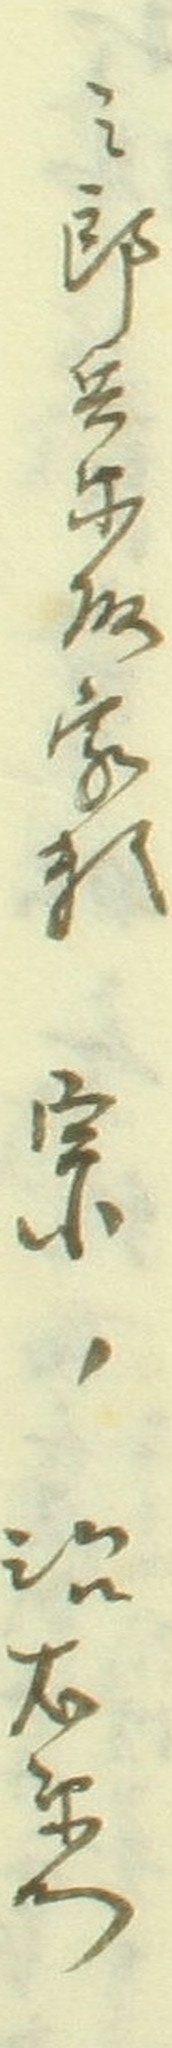三郎兵衛殿家頼宗ノ治右衛門
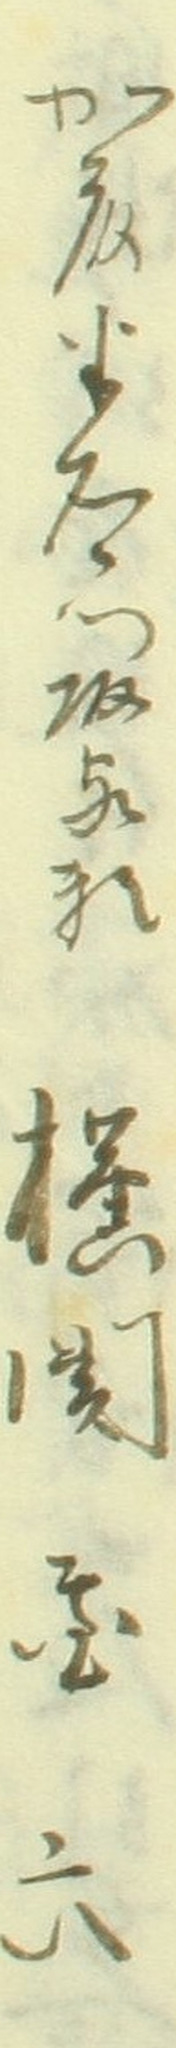加藤半右衛門殿家頼横関国六
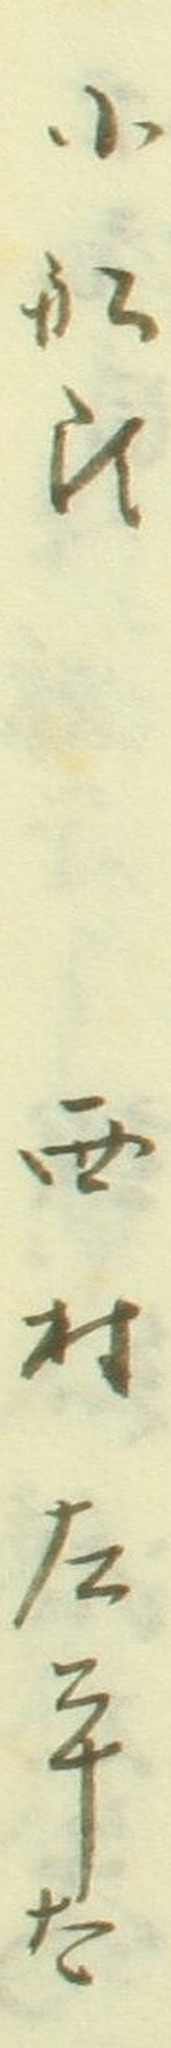小船頭西村左平太
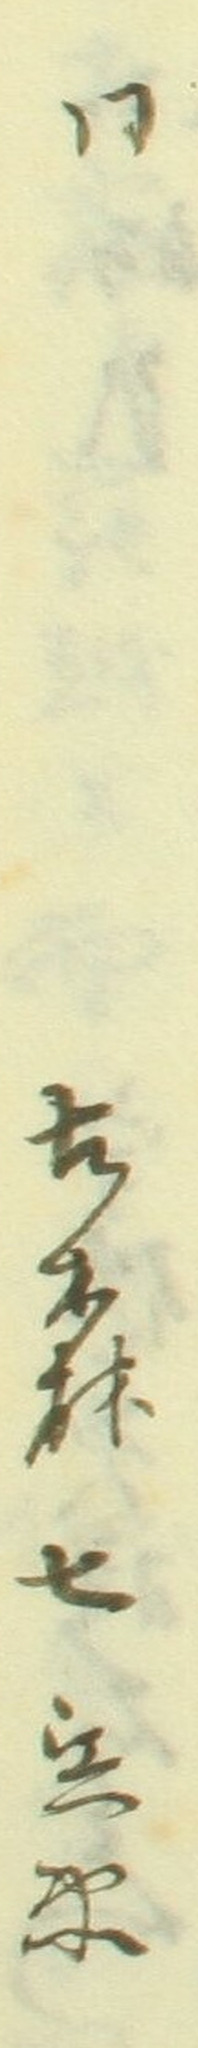同古森七兵衛
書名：唐船漂流記 三
